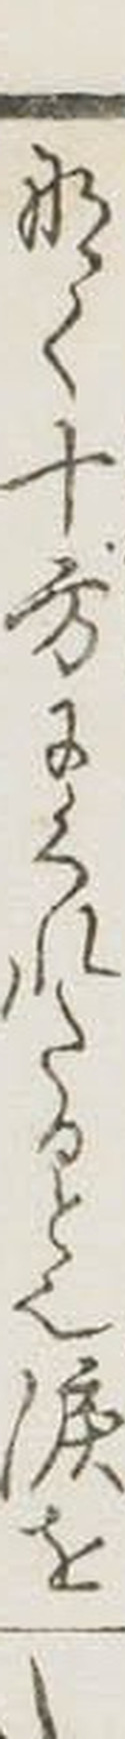なく十方にくれたると也涙を
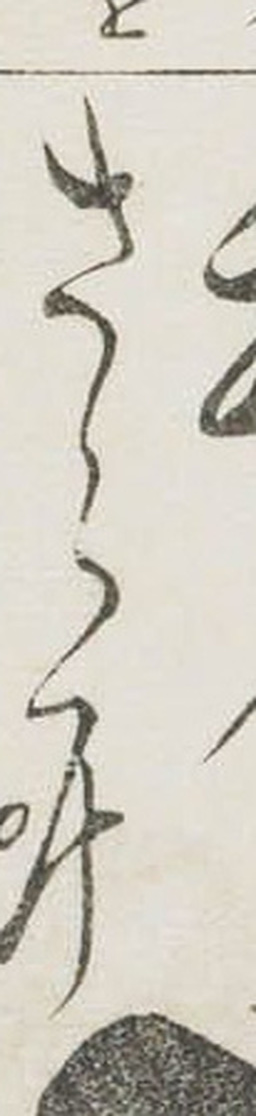さらに
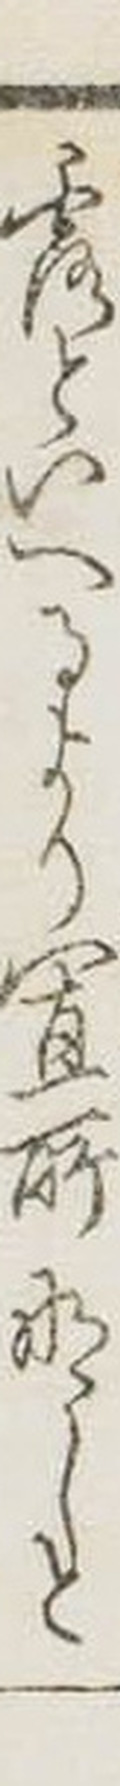露といへるより置所なしと
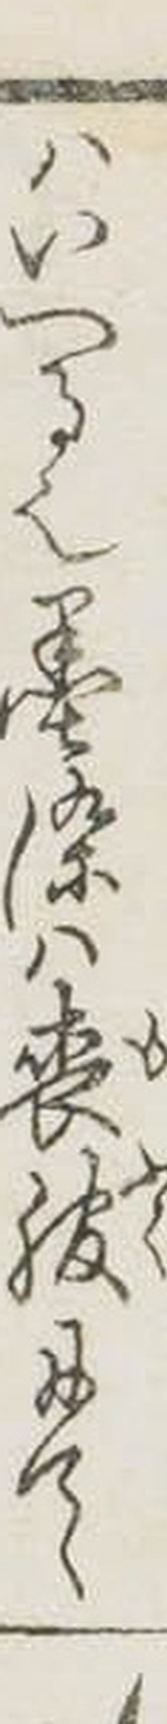はいへる也墨染は喪服にて
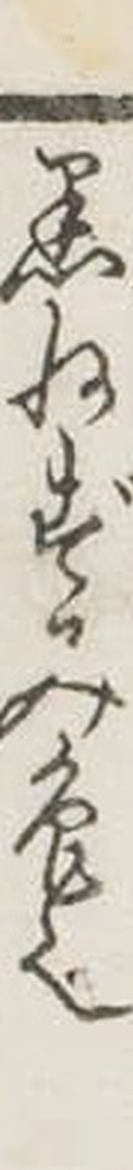黒ねずみ色也

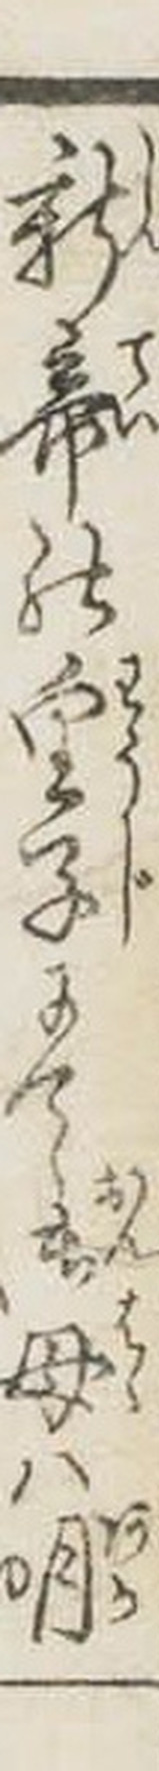新帝の皇子にて御母は明
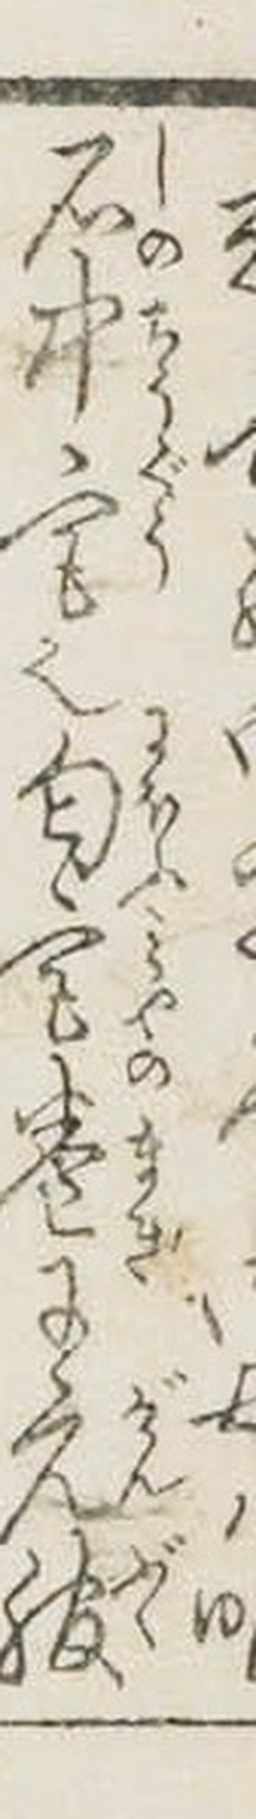石中宮也匂宮巻に元服
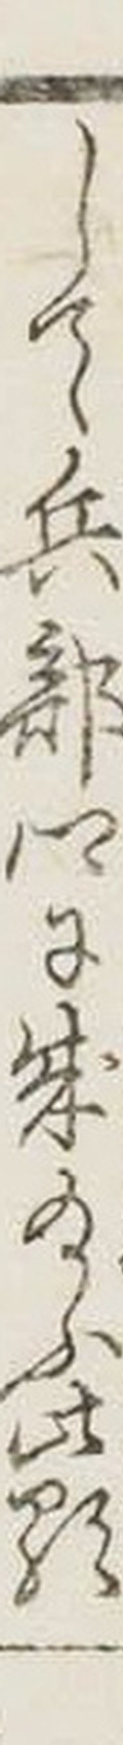して兵部卿に成給ふ此歌
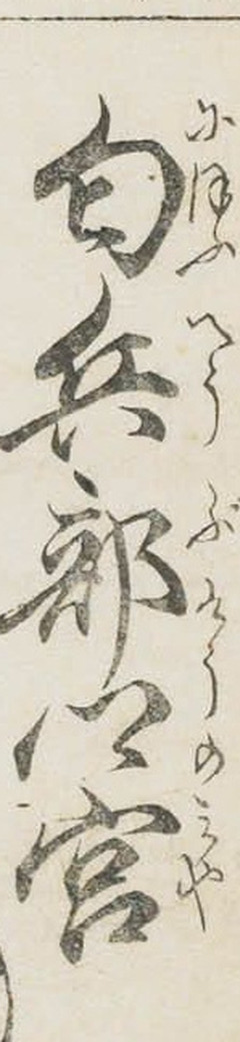匂兵部卿宮
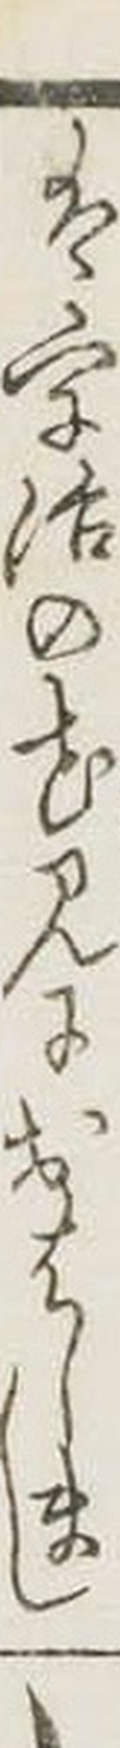は宇治の花見におはしまし
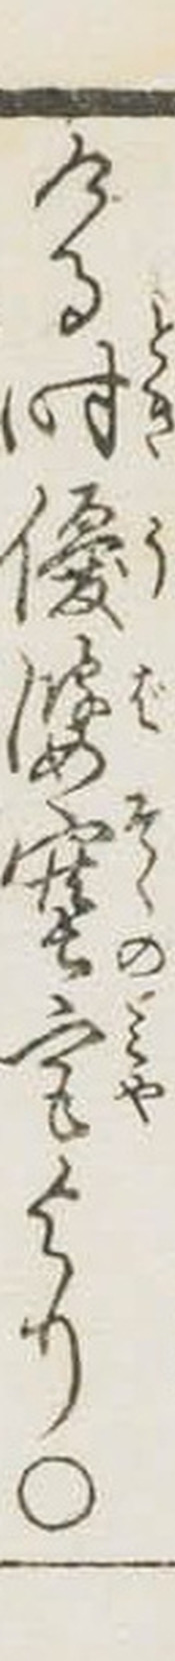ける時優婆塞宮より○
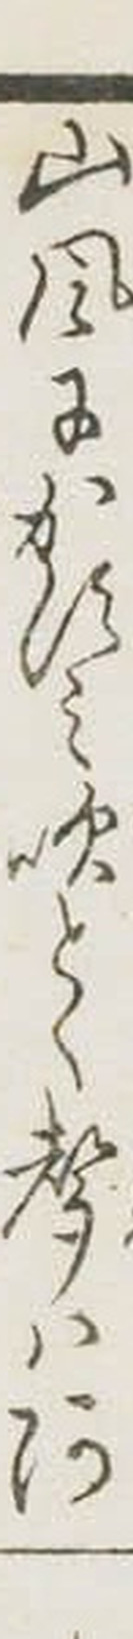山風にかすみ吹とく声はあ
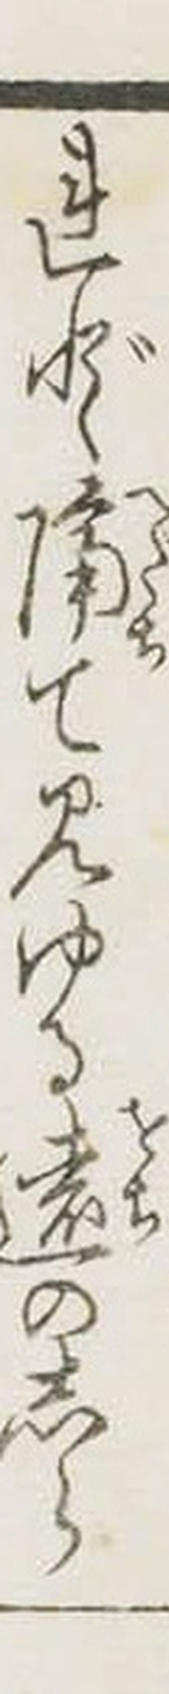れど隔て見ゆる遠のしら
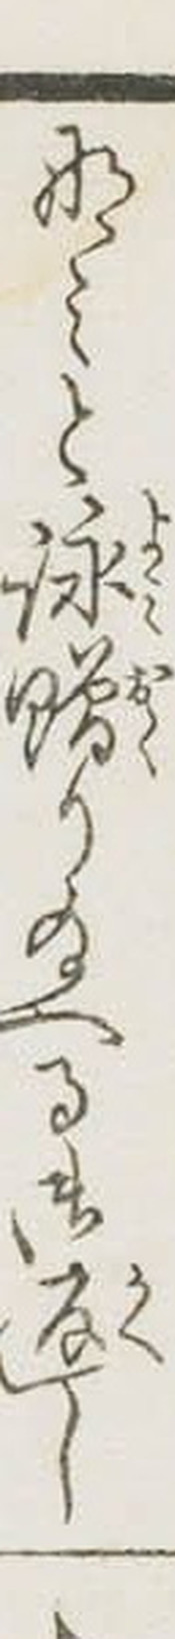なみと詠贈り給へる御返し
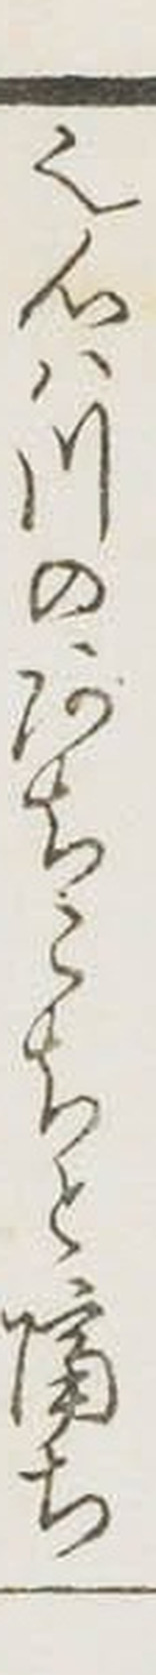也心は川のあちこちと隔ち
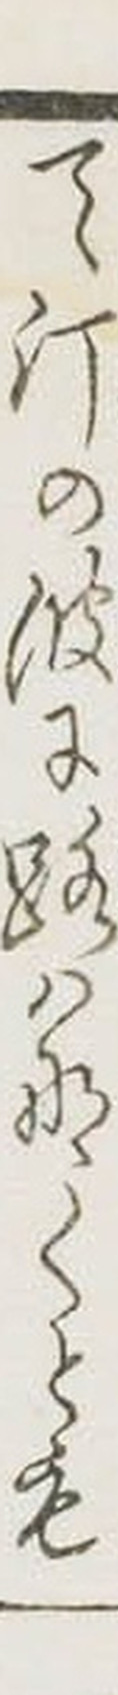て汀の波に路はなくとも
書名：源氏百人一首
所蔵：東京学芸大学教育コンテンツアーカイブ
